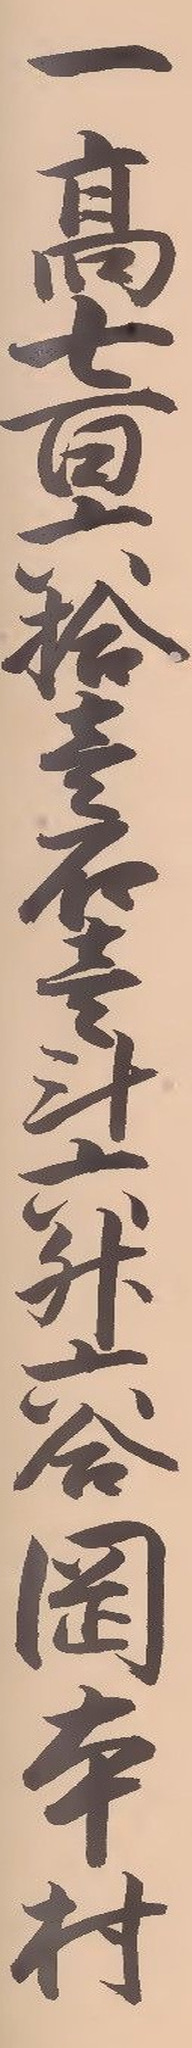一高七百六拾壱石壱斗六升六合岡本村
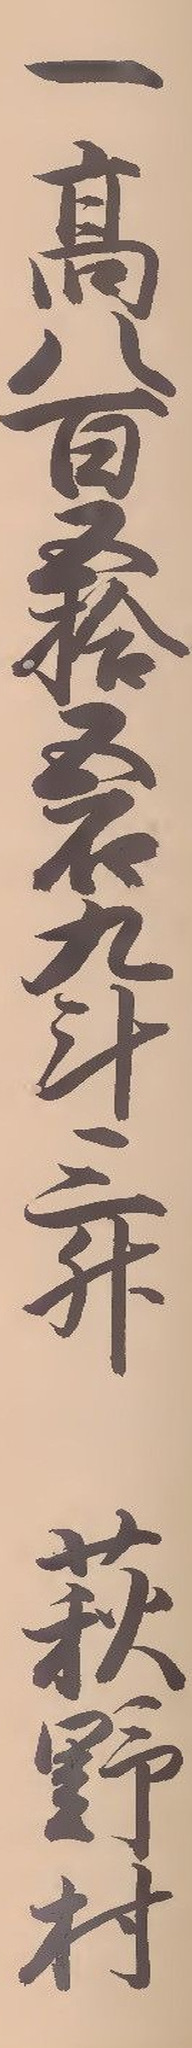一高八百五拾五石九斗三升萩野村
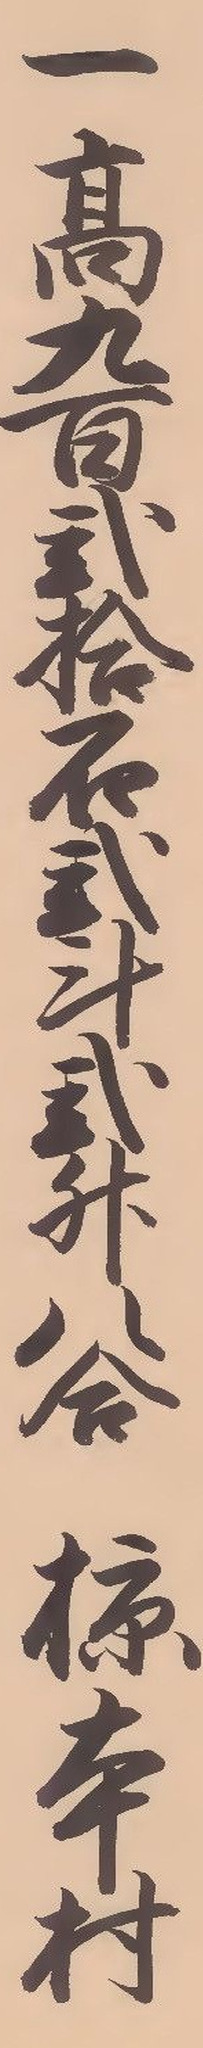一高九百弐拾石弐斗弐升八合椋本村
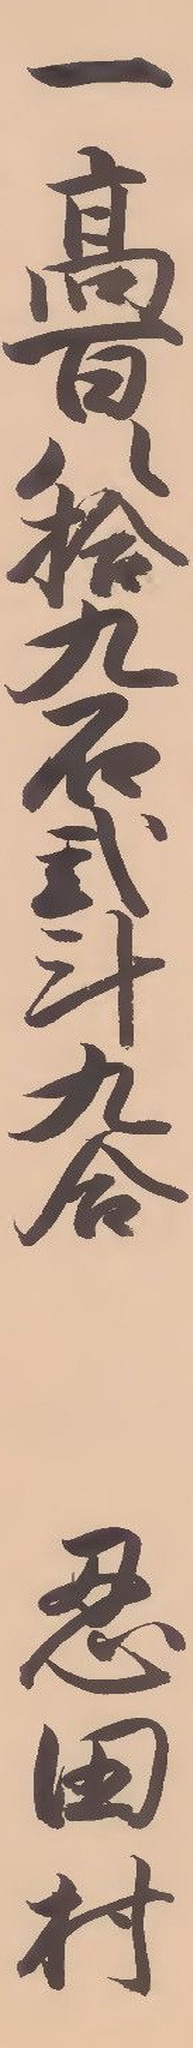一高百八拾九石弐斗九合忍田村
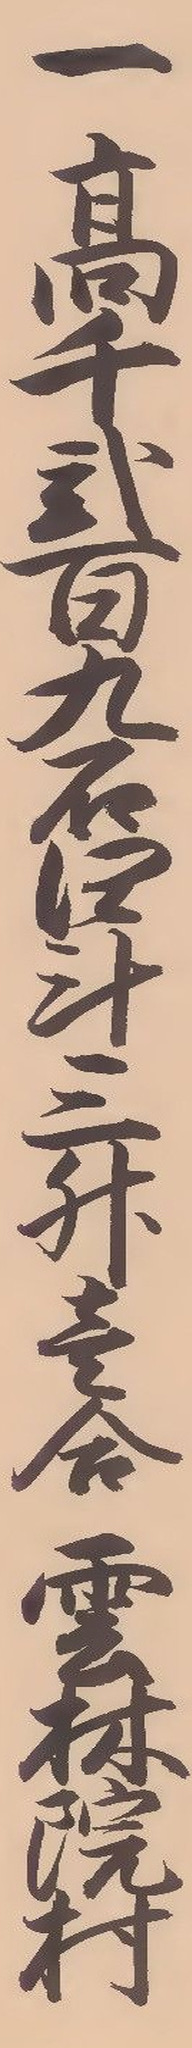一高千弐百九石四斗三升壱合雲林院村

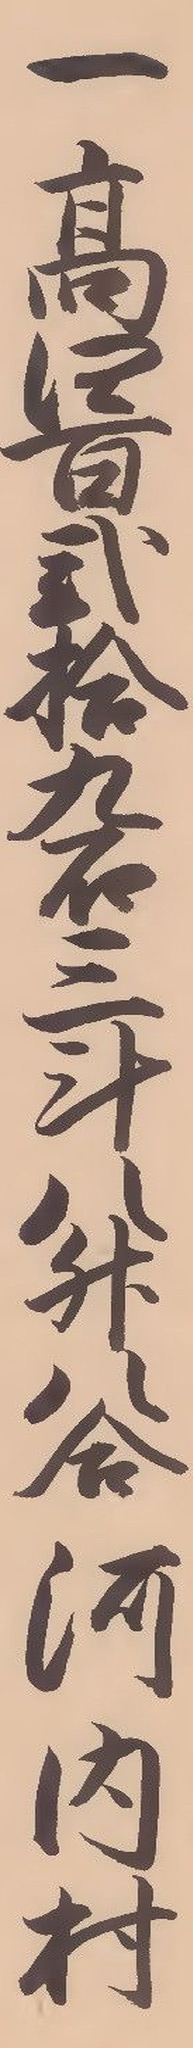一高四百弐拾九石三斗八升八合河内村
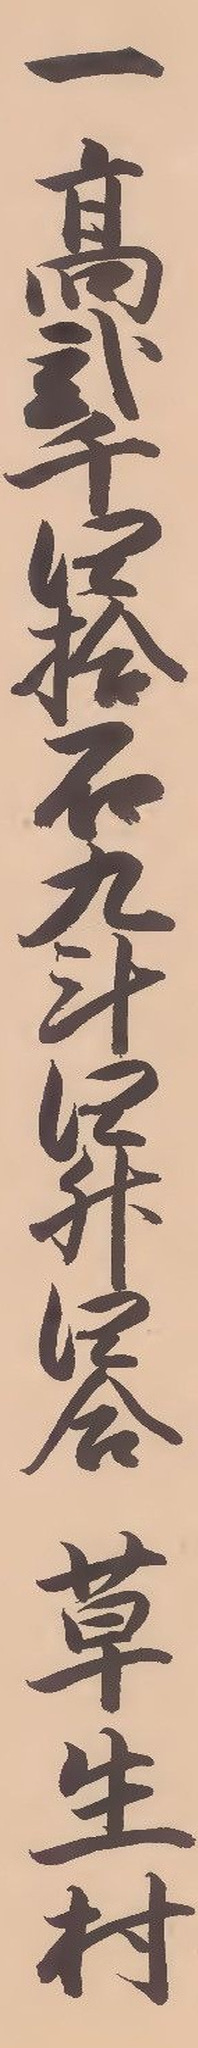一高弐千四拾石九斗四升四合草生村
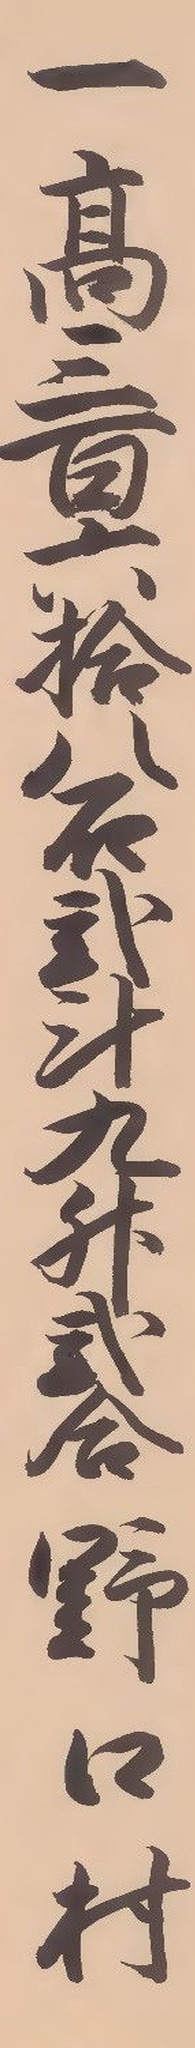一高三百六拾八石弐斗九升弐合野口村
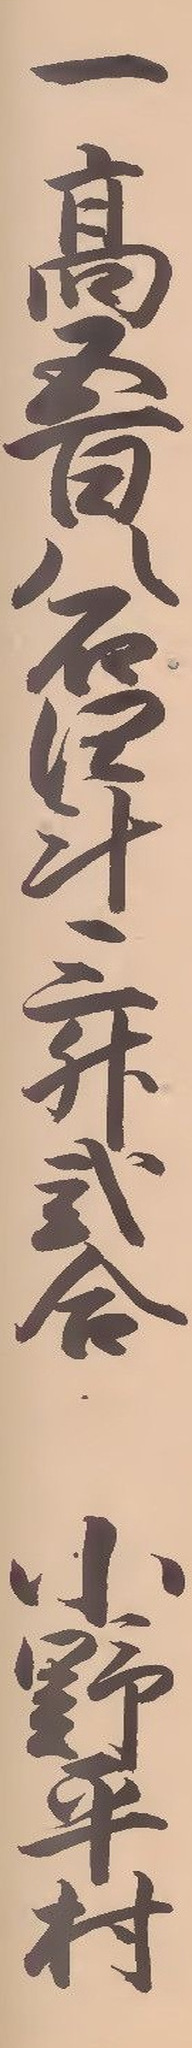一高五百八石四斗三升弐合小野平村
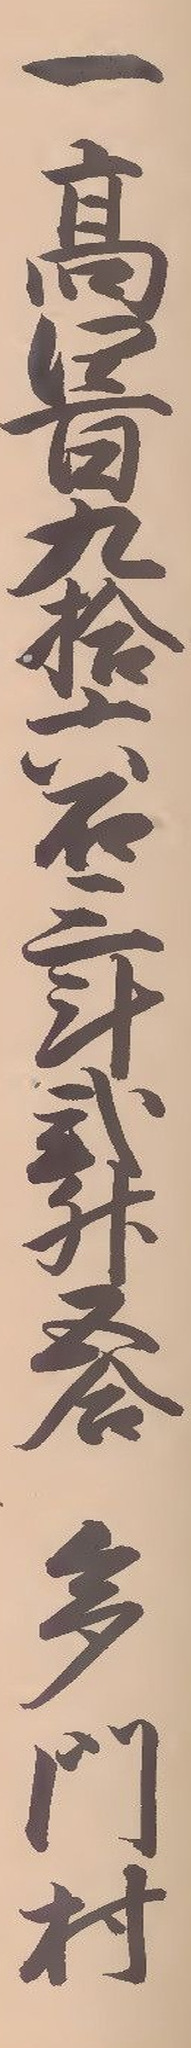一高四百九拾六石三斗弐升五合多門村
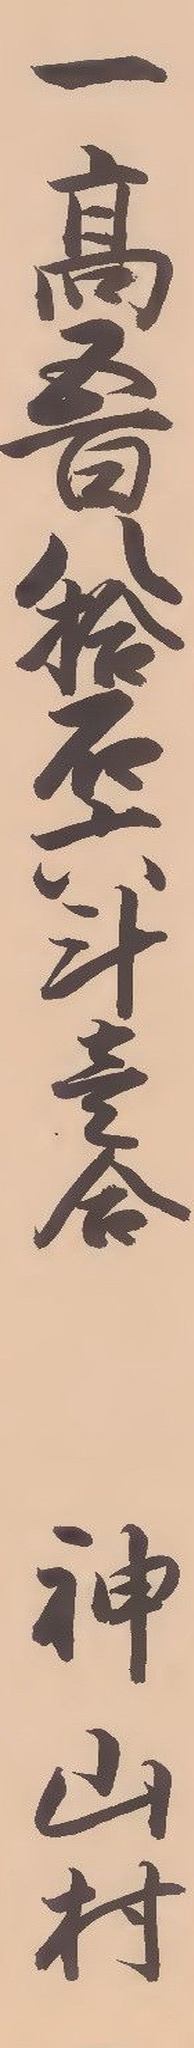一高五百八拾石六斗壱合神山村
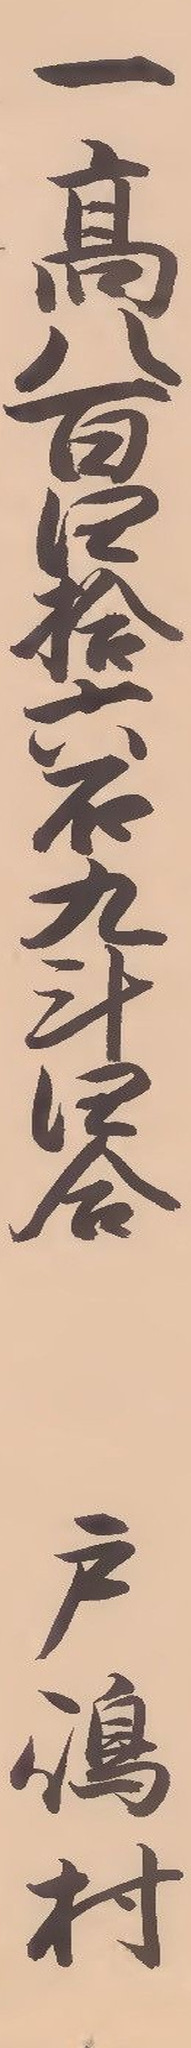一高八百四拾六石九斗四合戸嶋村
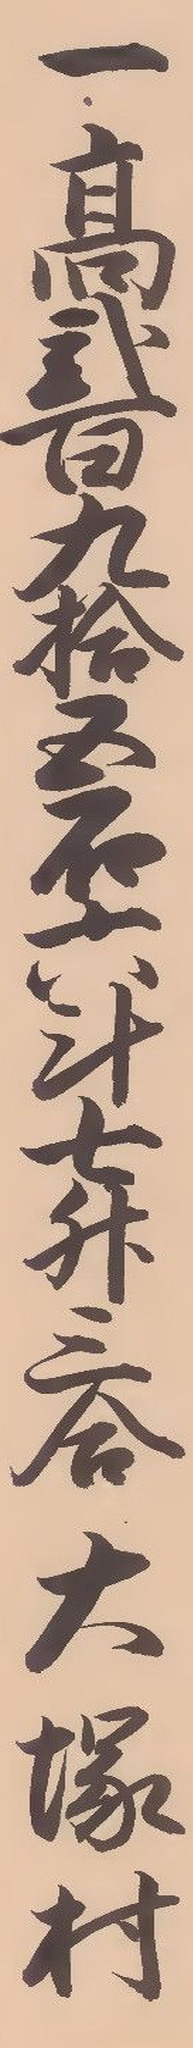一高弐百九拾五石六斗七升三合大塚村

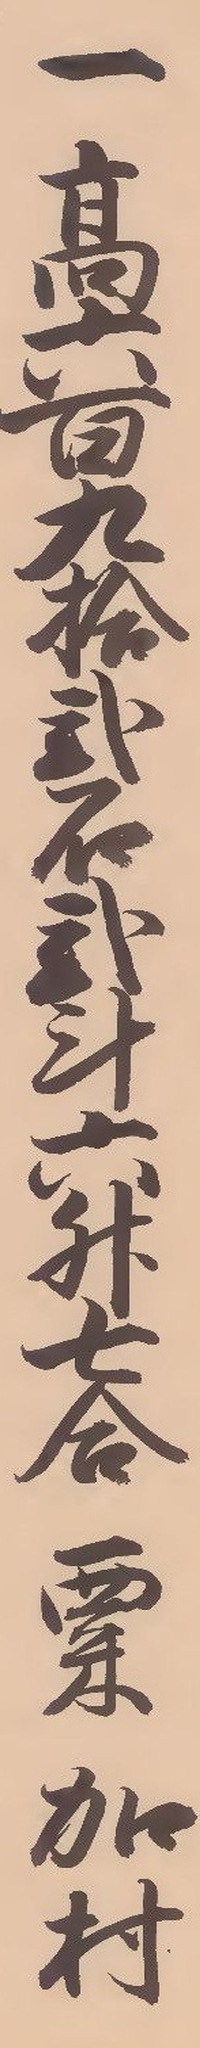一高六百九拾弐石弐斗六升七合粟加村
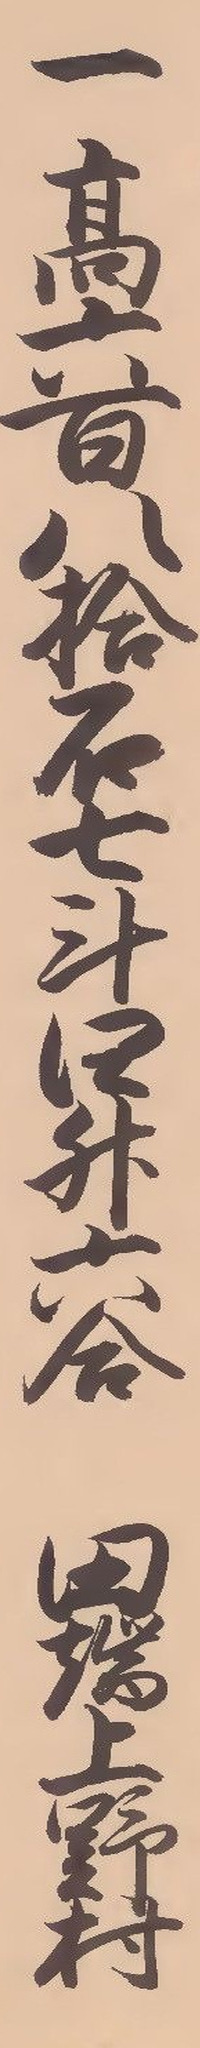一高六百八拾石七斗四升六合田端上野村
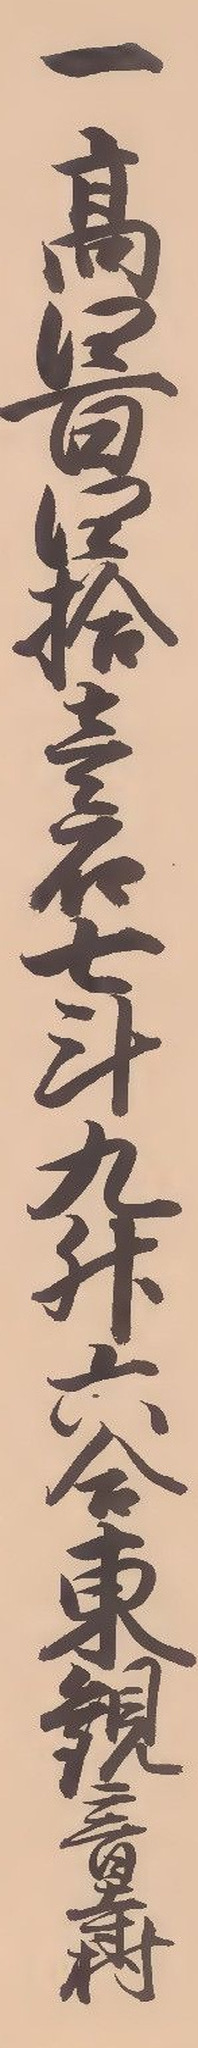一高四百四拾壱石七斗九升六合東観音寺村
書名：伊勢国郷帳
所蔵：国立公文書館 National Archives of Japan
